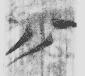少
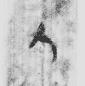人
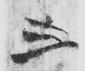之
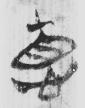惪
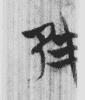隹
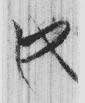女
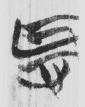怠
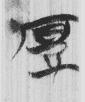厚
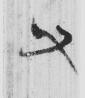父
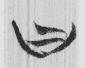曰
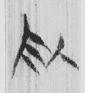於
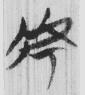{虍乎}
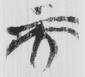天
